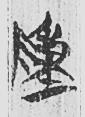陳
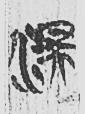淏
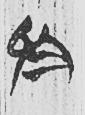於
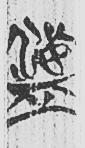溋
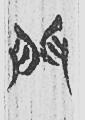門
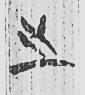之
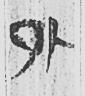外
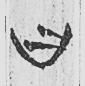曰
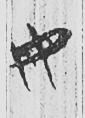母
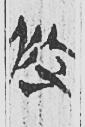攸
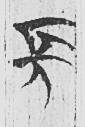長
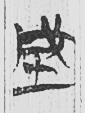城
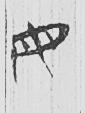母
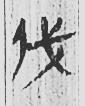伐
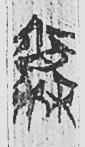{㐭秝}
